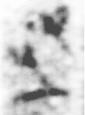○（右）
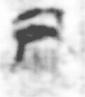尹
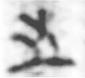之
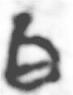白
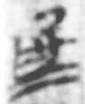爲
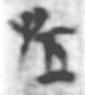○（左）
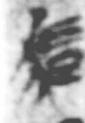驂
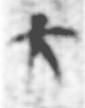大
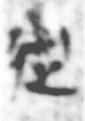迅
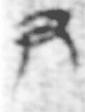尹
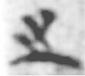之
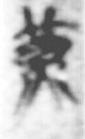黃
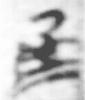爲
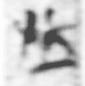○（左）
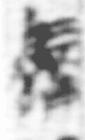○（服）
